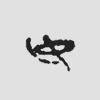女
